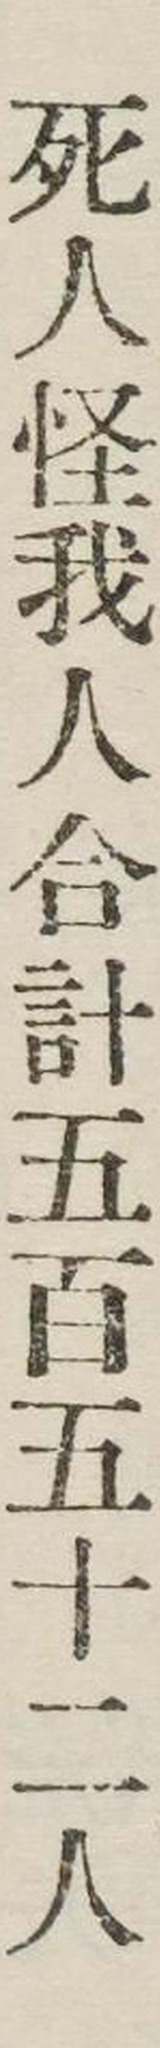死人怪我人合計五百五十二人
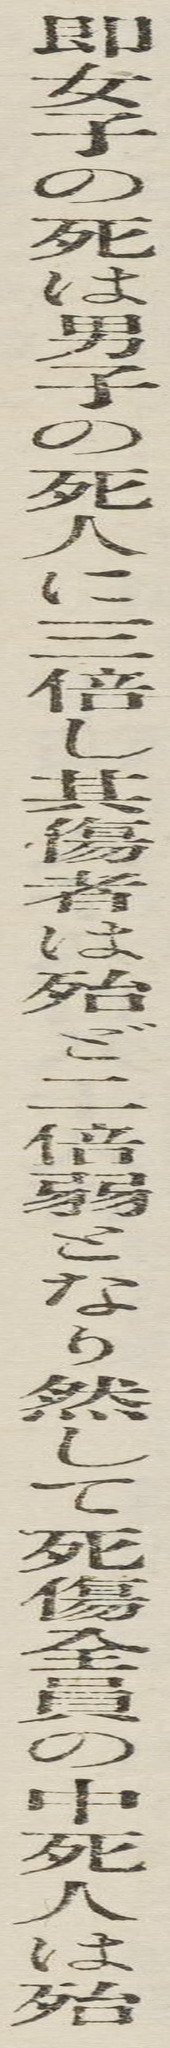即女子の死は男子の二人に三倍し其傷者は殆ど二倍弱となり然して死傷全員の中死人は殆
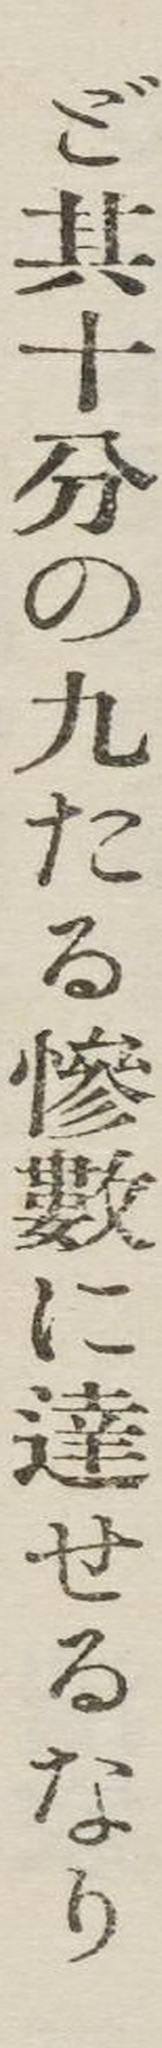ど其十分の九たる惨数に達せるなり
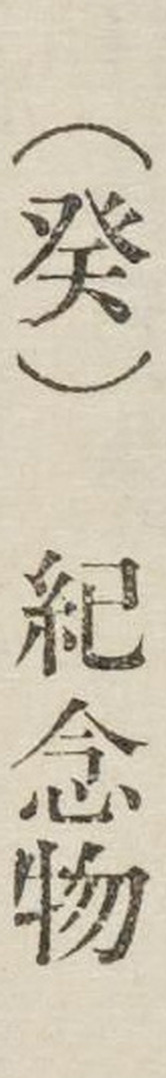紀念物
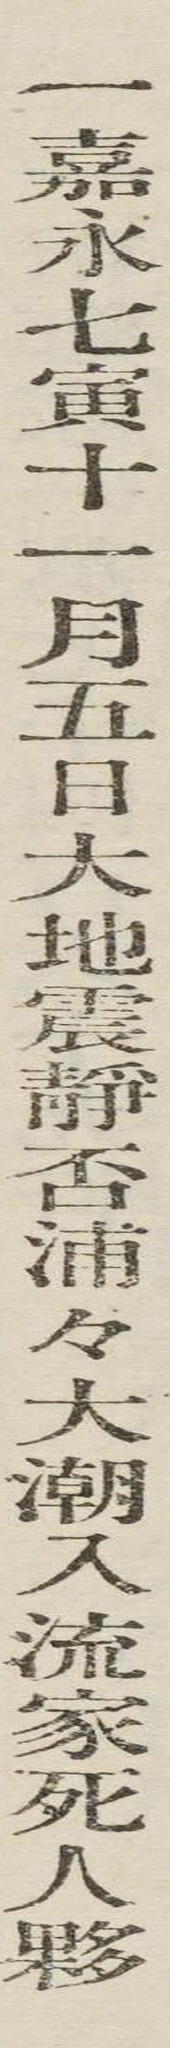一嘉永七寅一一月五日大地震静否浦々大潮入流家死人夥
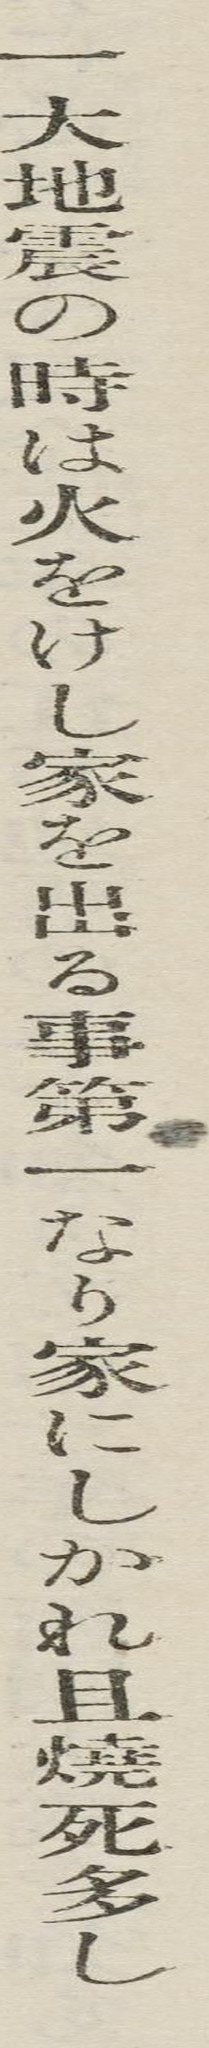一大地震の時は火をけし家を出る事第一なり家にしかれ且焼死多し
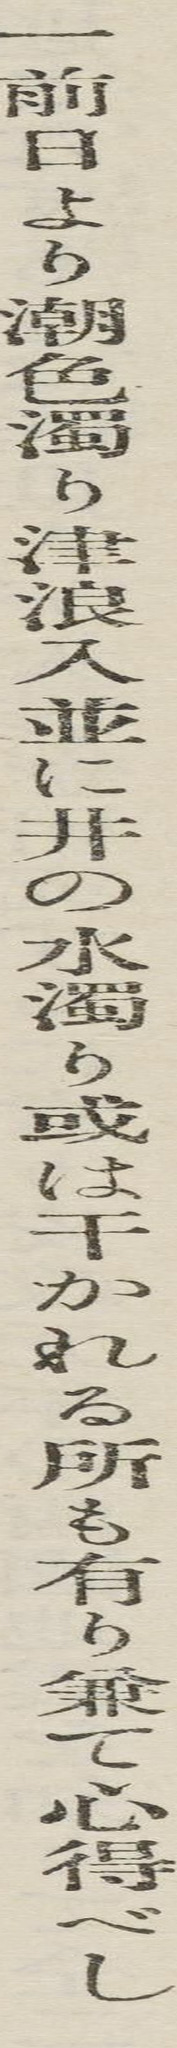一前日より潮色濁り津浪入並に井の水濁り或は干かれる所も有り兼て心得べし
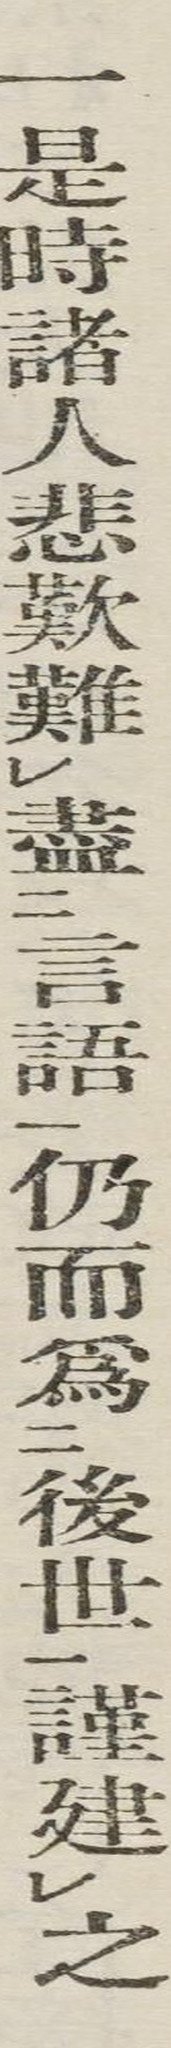一是時諸人悲歎難盡言語仍而溜後世謹建之
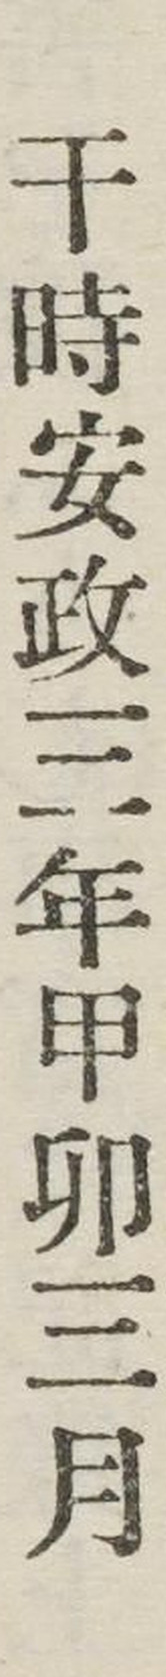干時安政三年甲卯三月
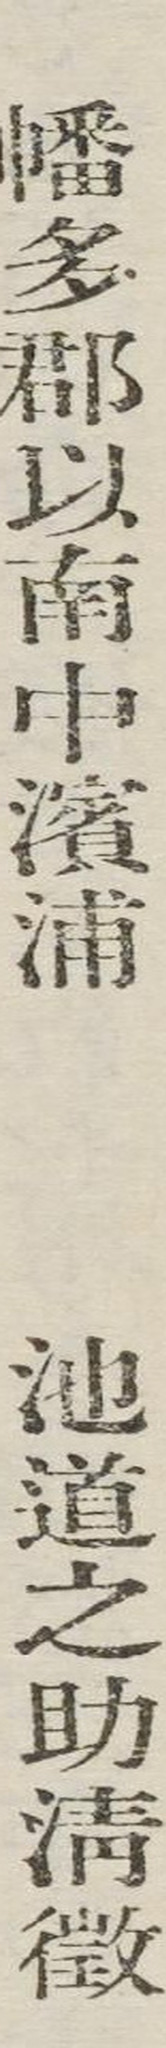幡多郡以南中浜浦池道之助清徴
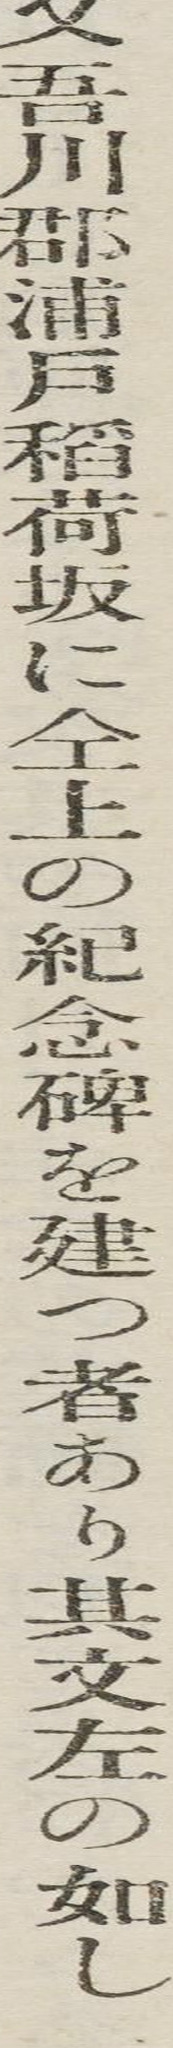又吾川郡浦戸稲荷坂に同上の紀念碑を建つ者あり其文左の如し
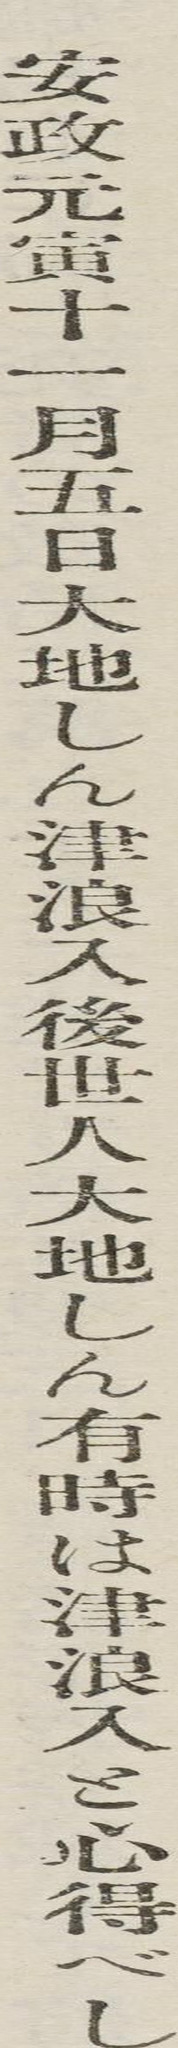安政元寅十一月五日大地しん津浪入後世人大地しん有時は津浪入と心得べし
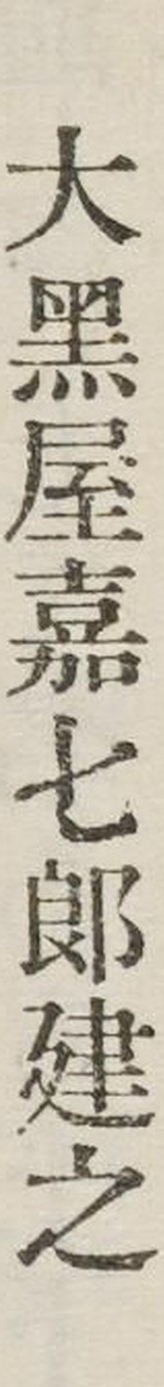大黑屋嘉七郎建之
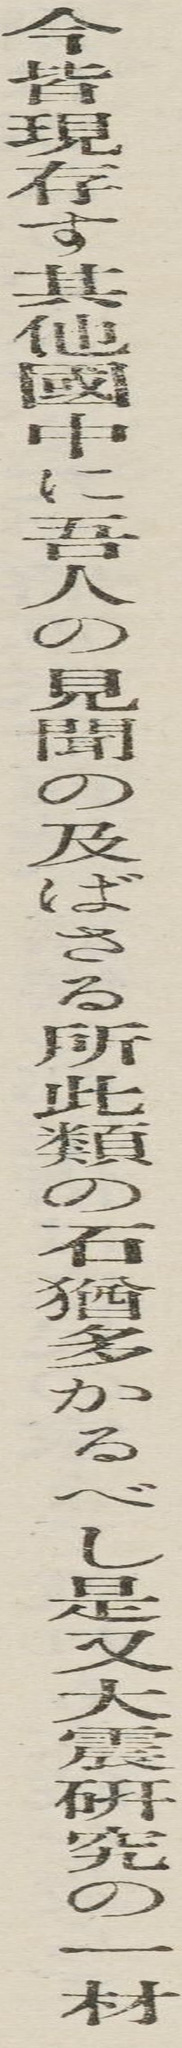今皆現存す其他国中に吾人の見聞の及ばざる所此類の石猶多かるべし是又大震研究の一材
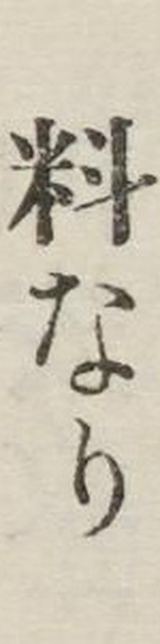料なり
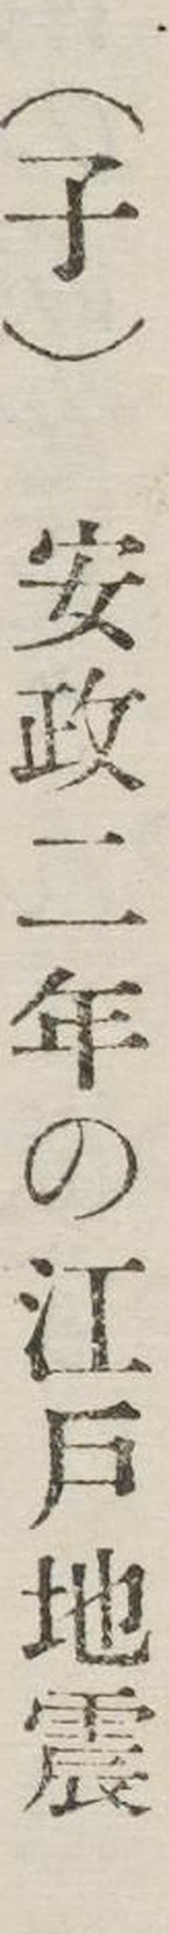安政二年の江戸地震
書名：土佐古今ノ地震
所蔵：東京大学地震研究所図書室 Earthquake Research Institute Library, The University of Tokyo, JAPAN
